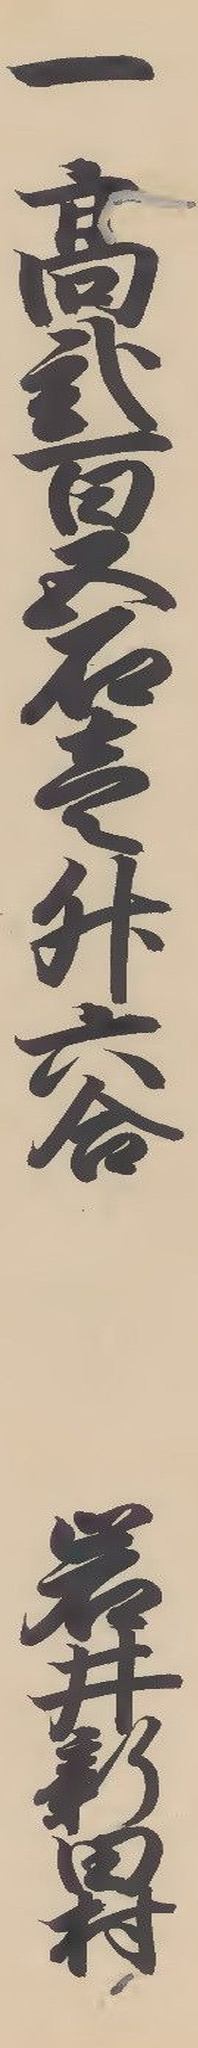一高弐百五石壱升六合岩井新田村
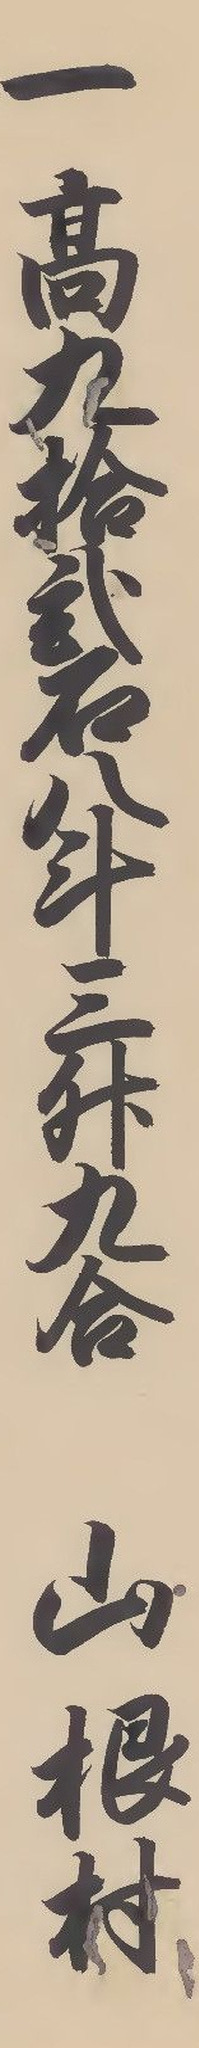一高九拾弐石八斗三升九合山根村
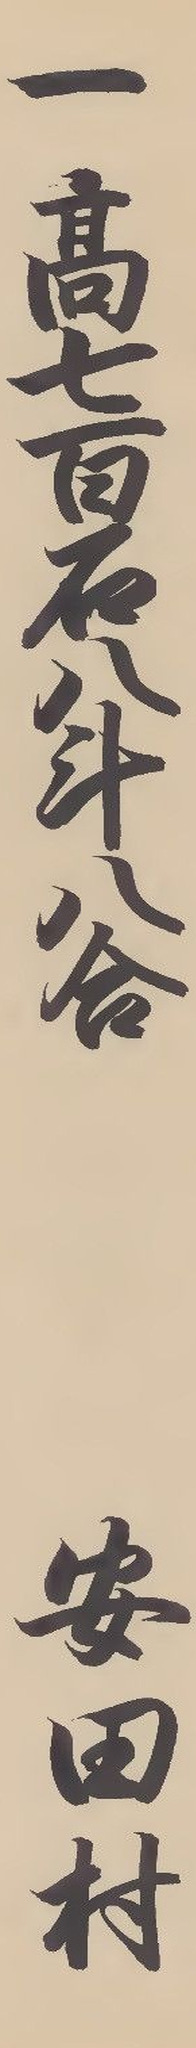一高七百石八斗八合安田村
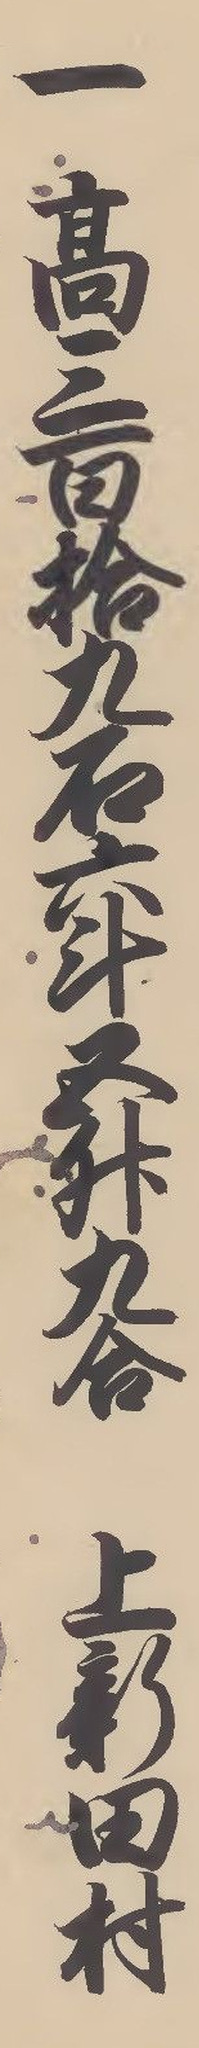一高三百拾九石六斗五升九合上新田村

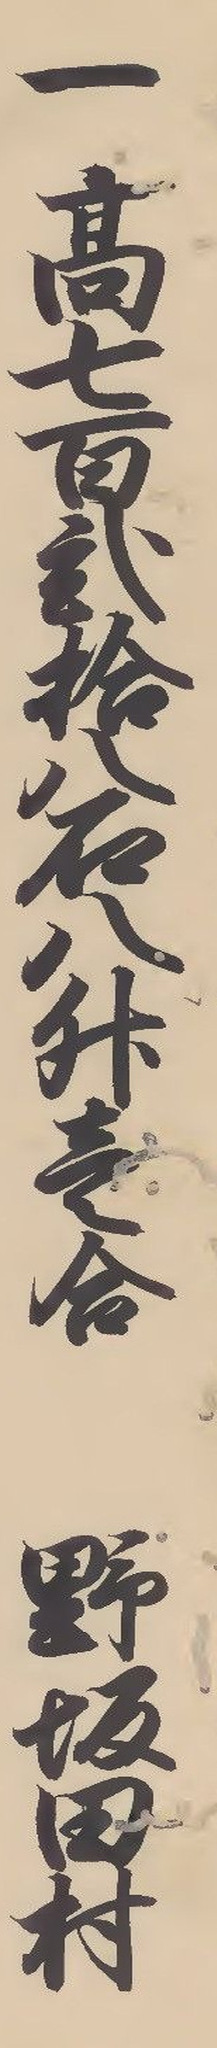一高七百弐拾八石八升壱合野坂田村
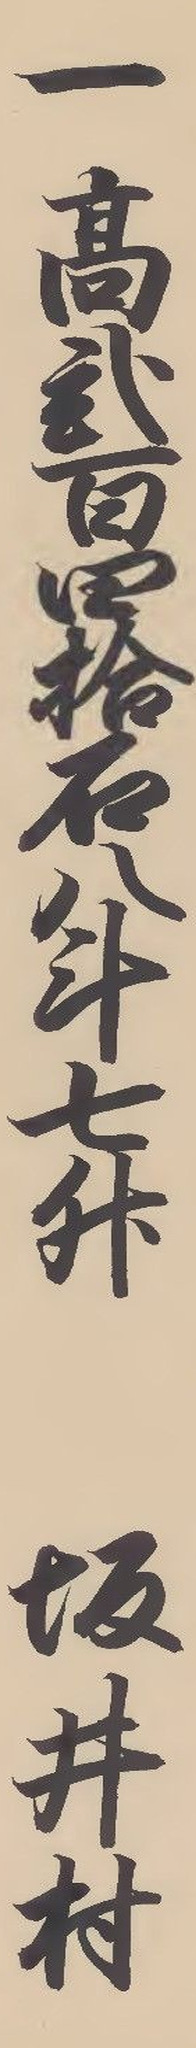一高弐百四拾石八斗七升坂井村
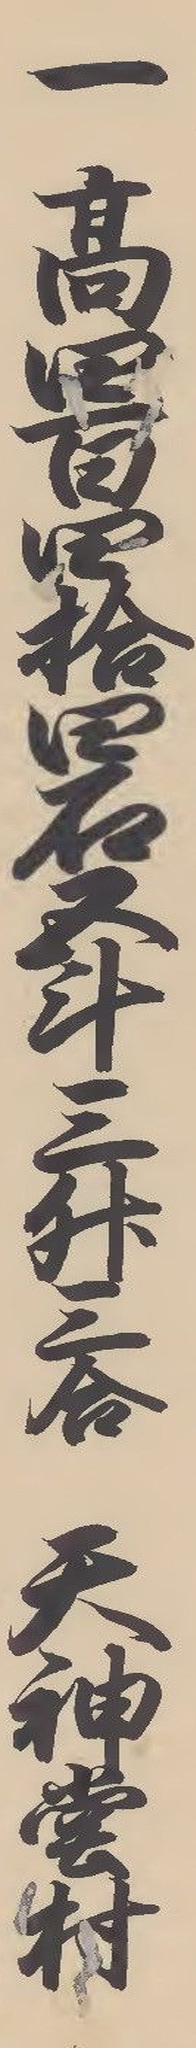一高四百四拾四石五斗三升三合天神堂村
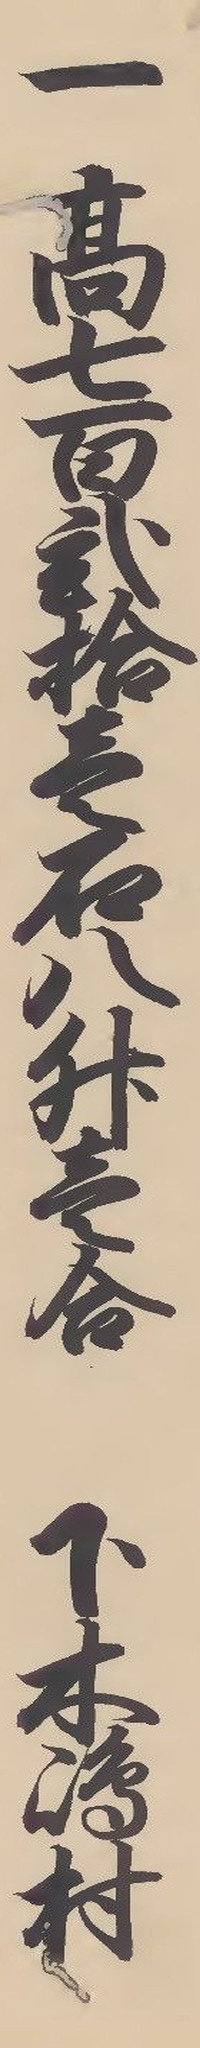一高七百弐拾壱石八升壱合下木島村
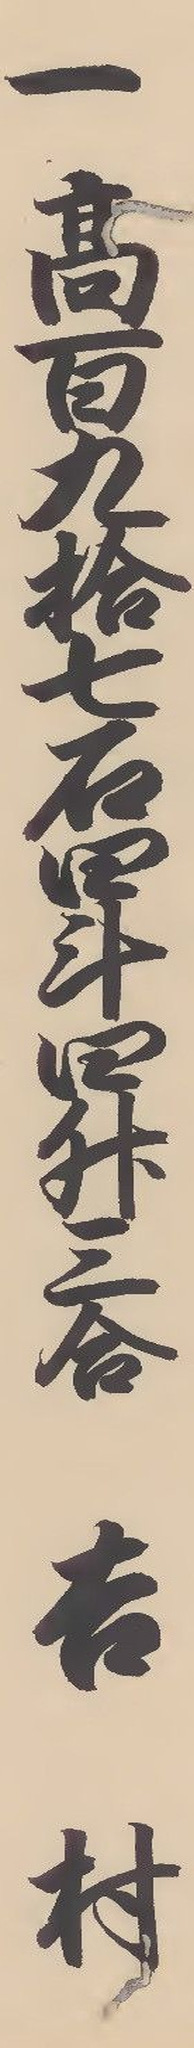一高百九拾七石四斗四升三合吉村
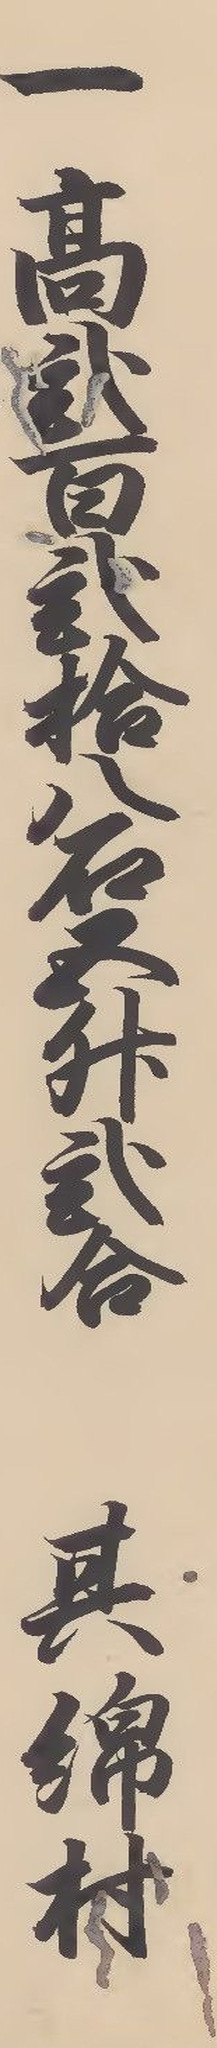一高弐百弐拾八石五升弐合其綿村
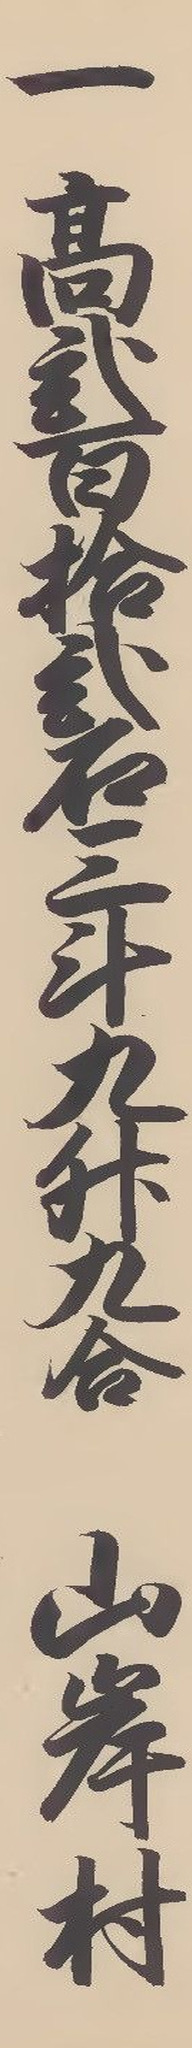一高弐百拾弐石三斗九升九合山岸村
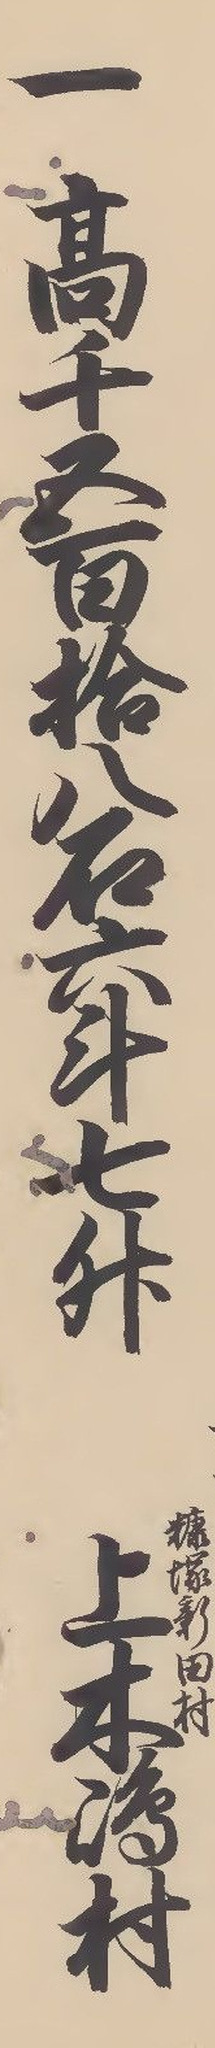一高千五百拾八石六斗七升上木島村

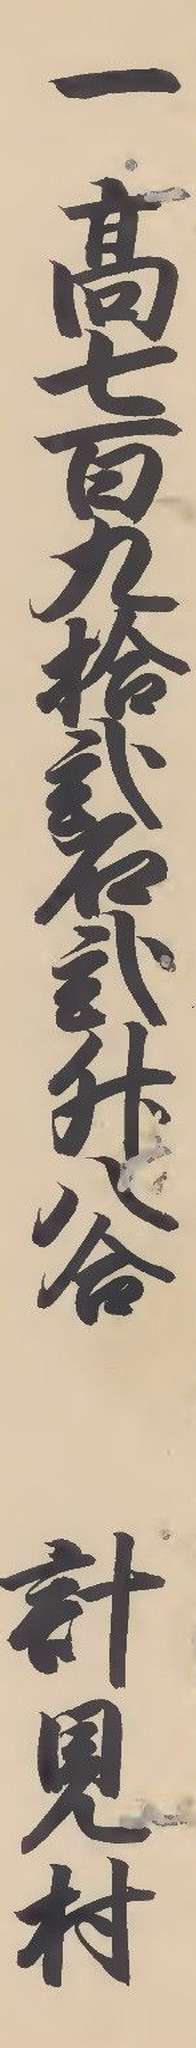一高七百九拾弐石弐升八合計見村
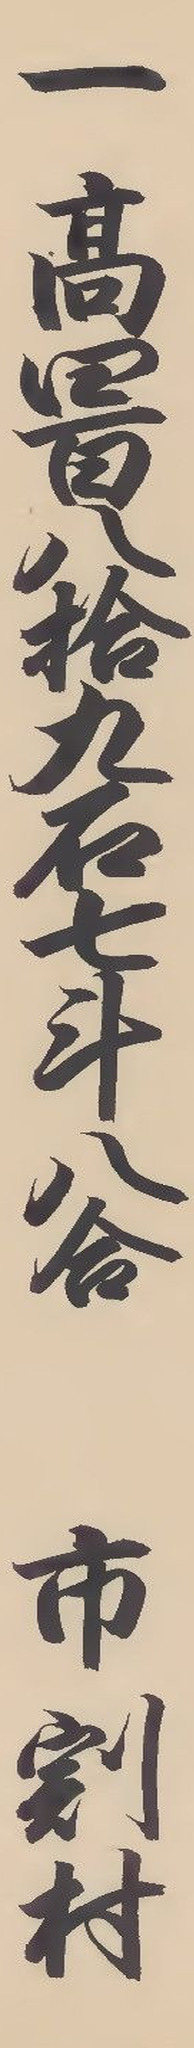一高四百八拾九石七斗八合市割村
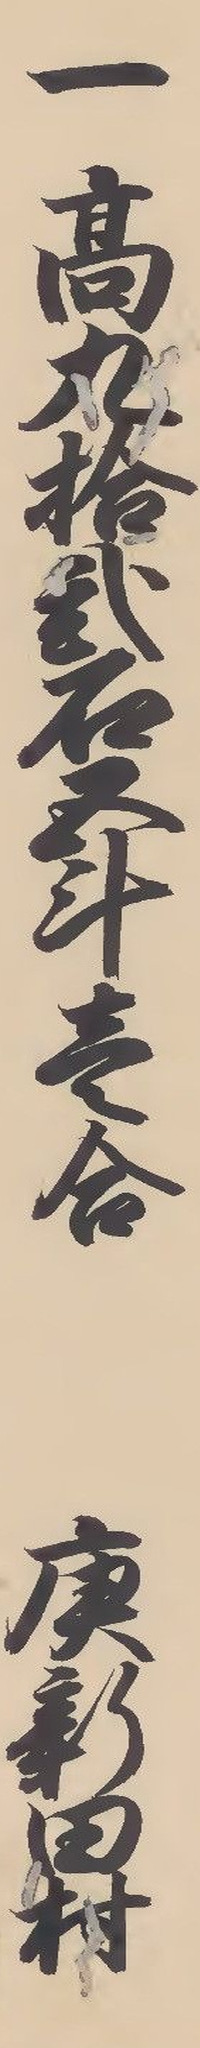一高九拾弐石五斗壱合庚新田村
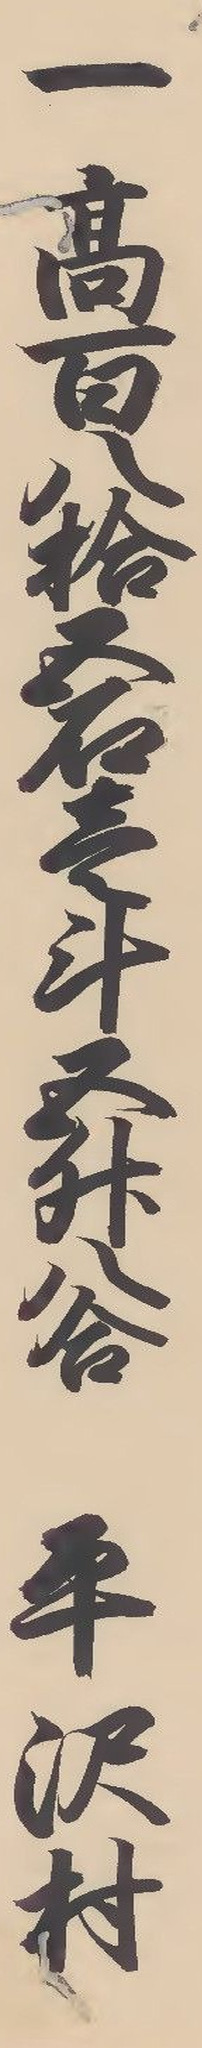一高百八拾五石壱斗五升八合平沢村
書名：信濃国郷帳
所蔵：国立公文書館 National Archives of Japan
